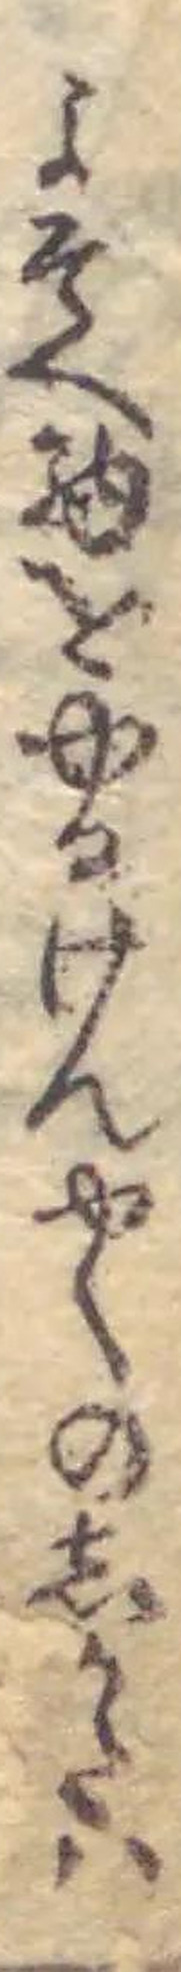よそへ物をやるけんやくのしかたとは
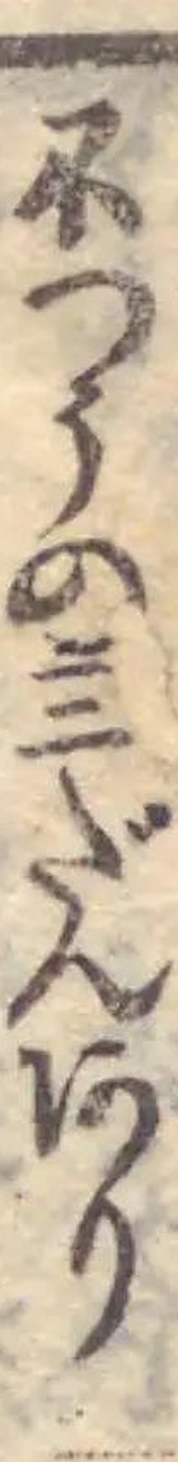ふつうの三だんあり
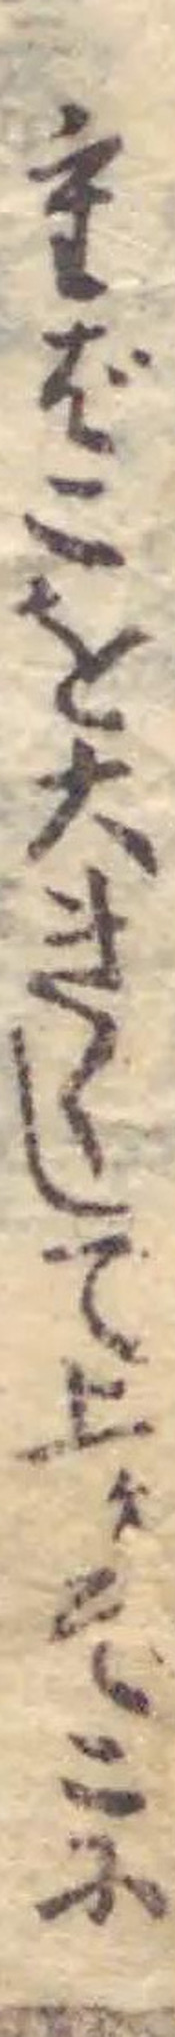重ばこを大きくして上
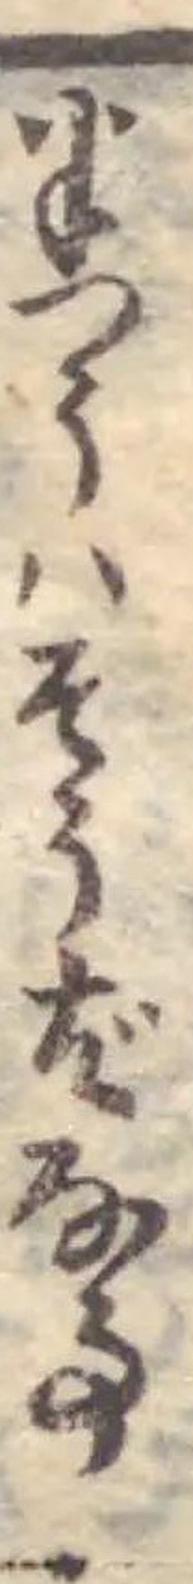半つうはそうばな事
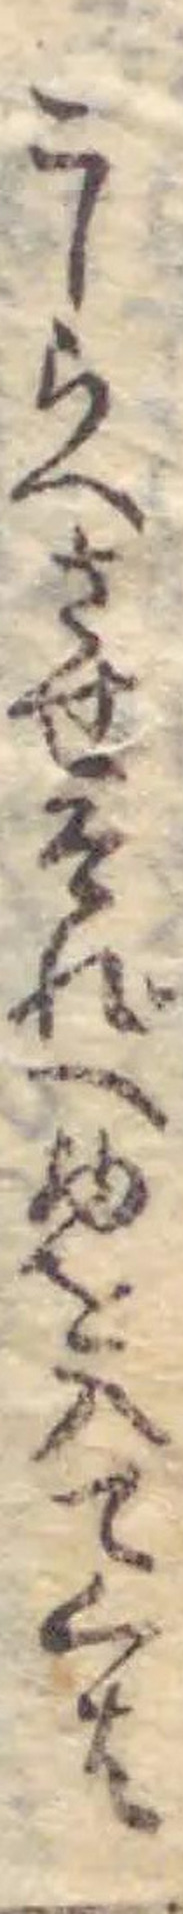こしらへさせそれへ物を入てくは
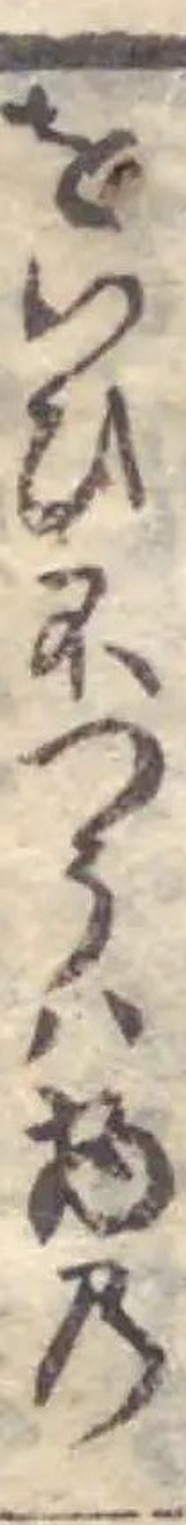をいひ不つうは物の
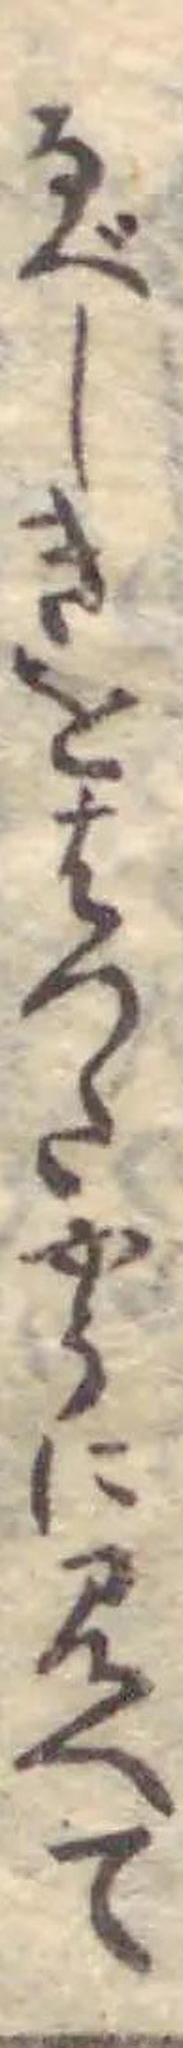るべしきをはつたやうに見へて
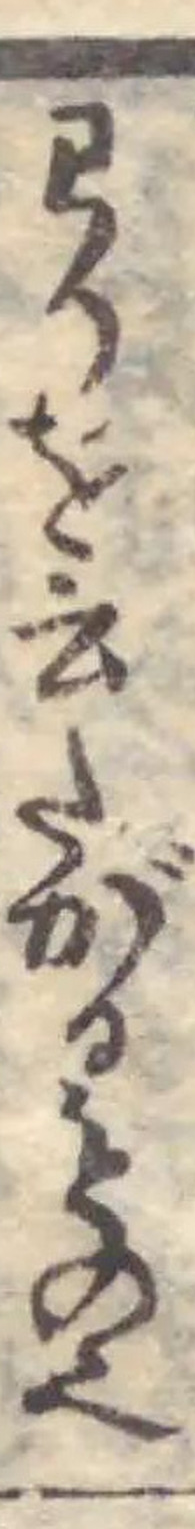わりを云たがるもの也
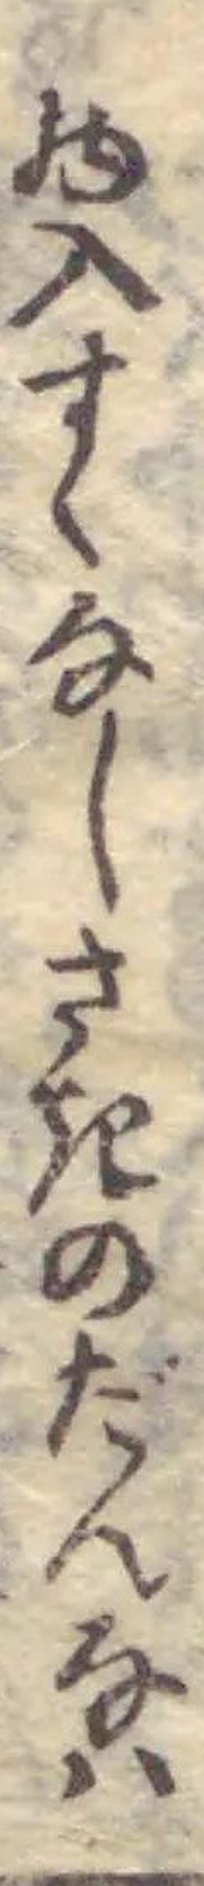物入すくなしさきのだんなは
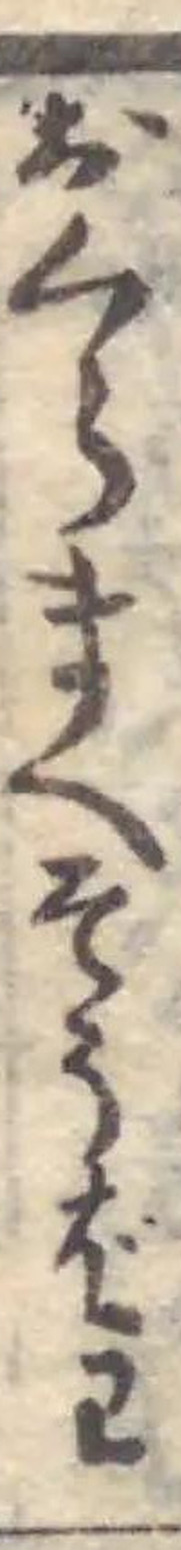おくらまへそうばわ
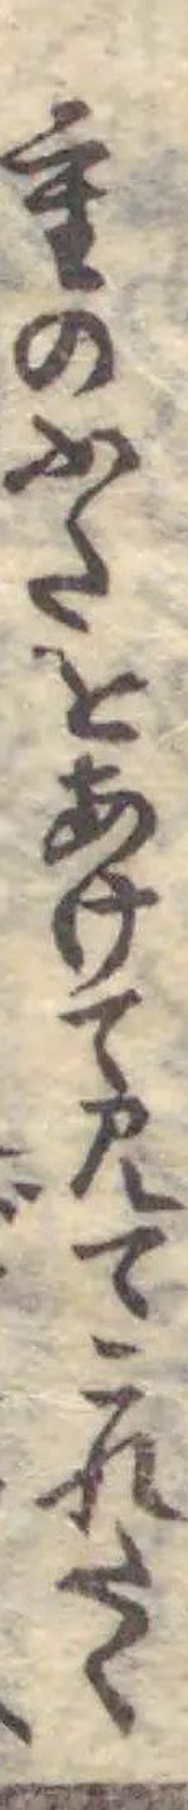重のふたをあけて見てこれたく
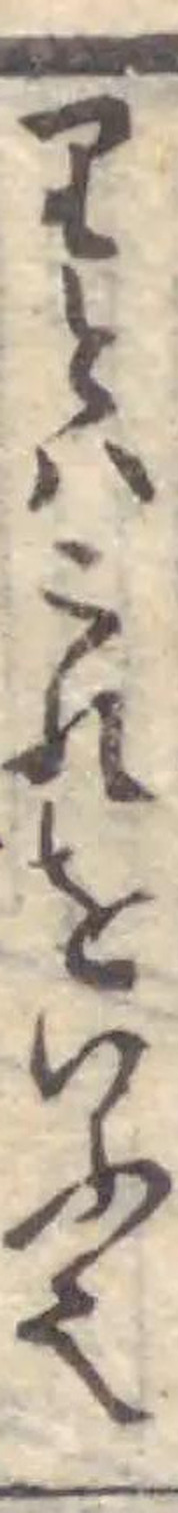りとはこれをいふ也
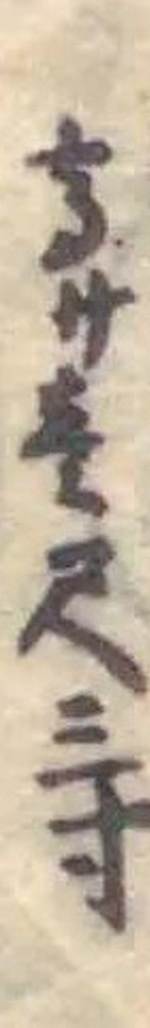高二尺三寸
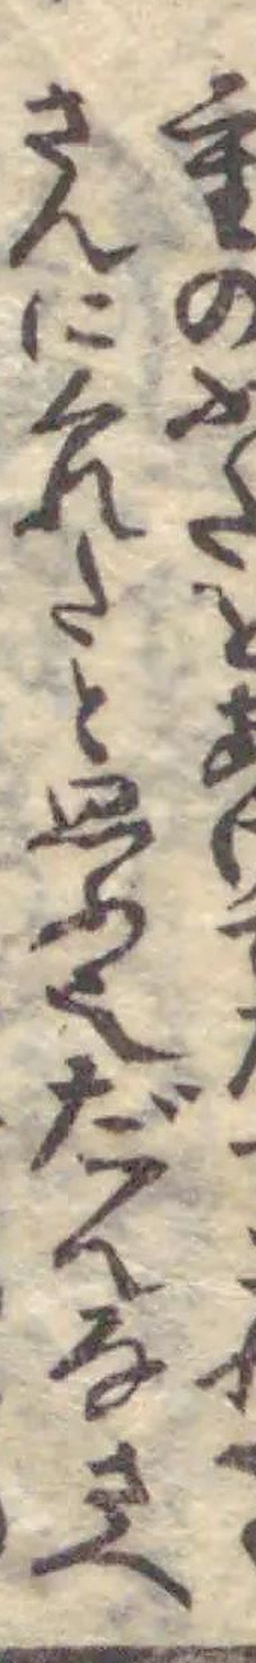さんにくれたと思ふ也だんなさへ
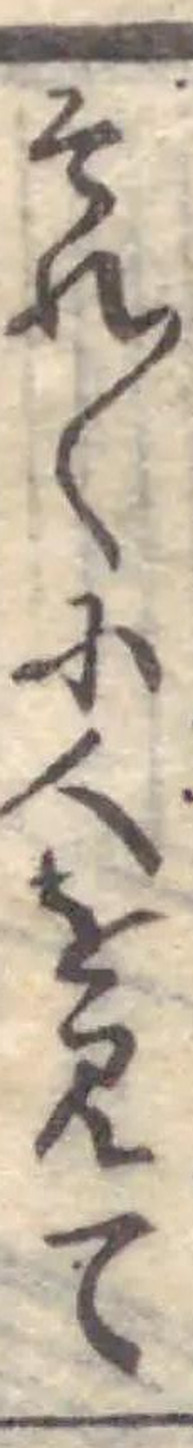それ〳〵に人を見て
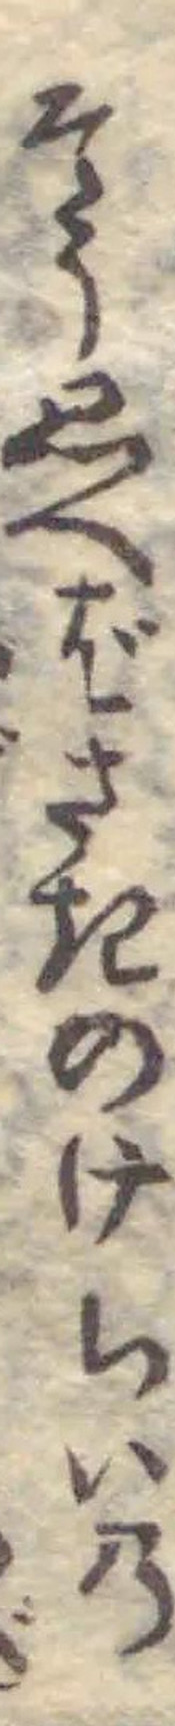そう思へばさきのけらいの
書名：大通人好記
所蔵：国立国会図書館 National Diet Library, JAPAN
